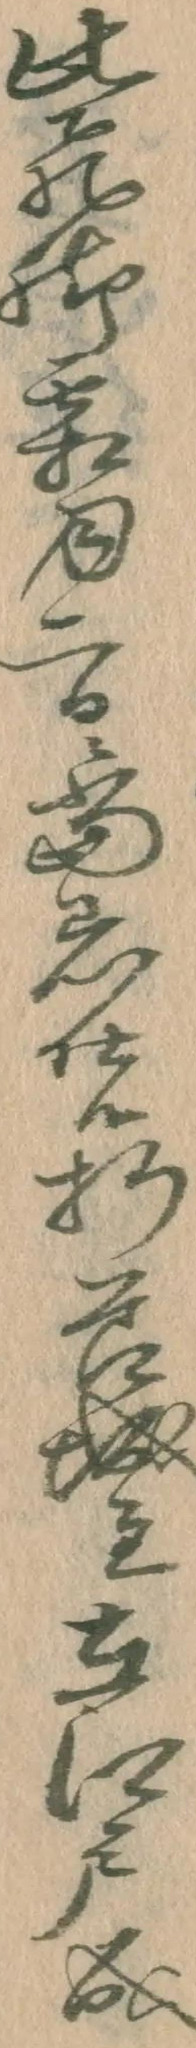此飛脚霜月二日に当着仕候折節城主在江戸成
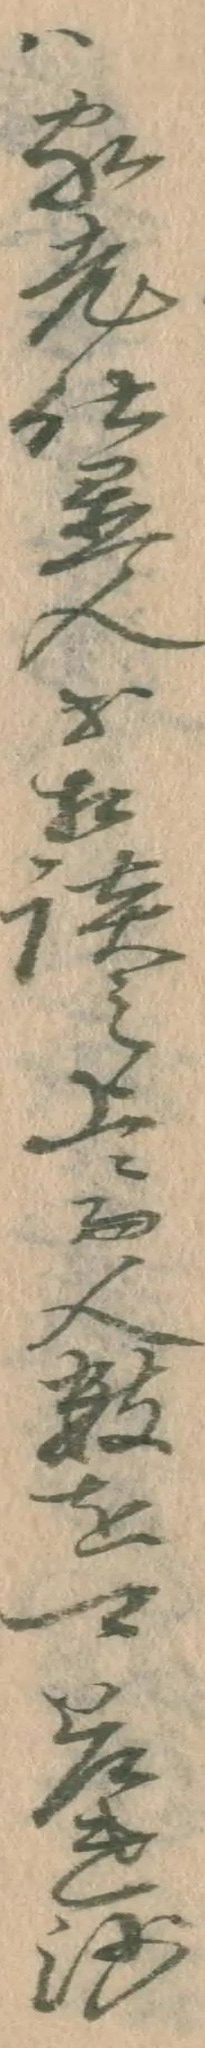は家老仕置人等相談之上に而人数を可差遣沙
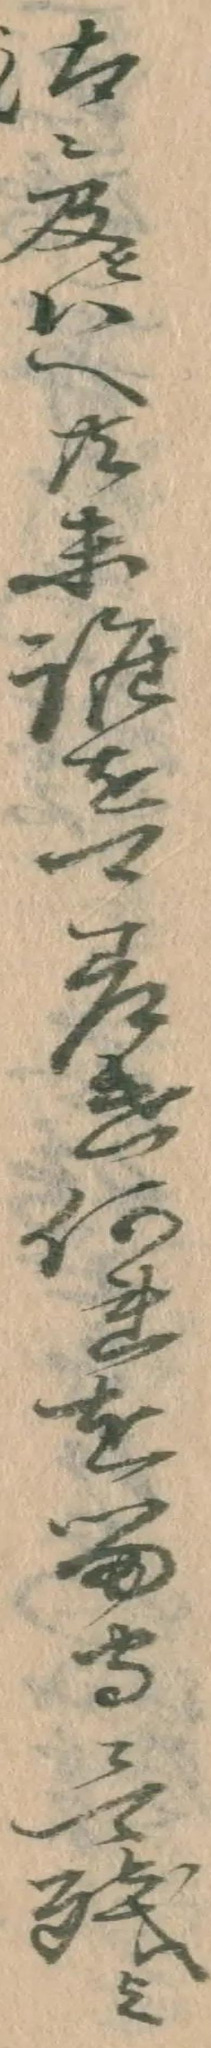太に及といへ共未誰を可差遣何連を留守に可残与
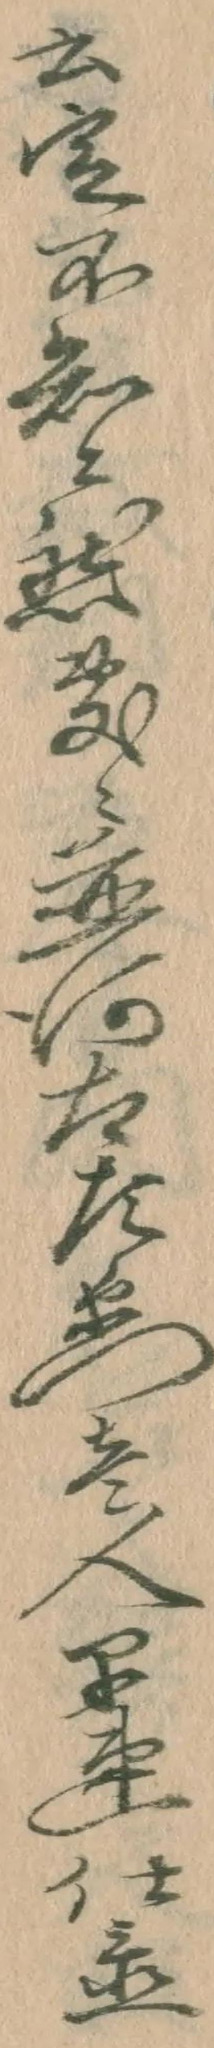云定不知に然處に並河太左衛門壱人早速仕置
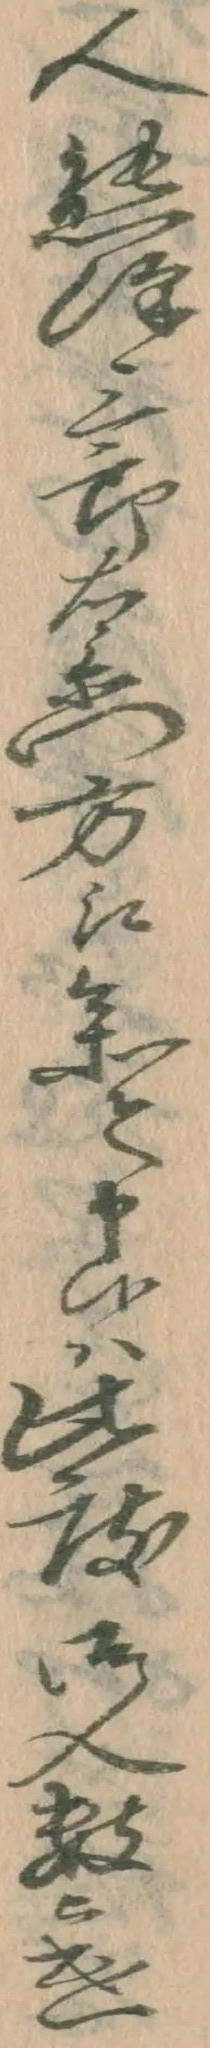人熊沢三郎右衛門方江参て申候は此度御人数に遣
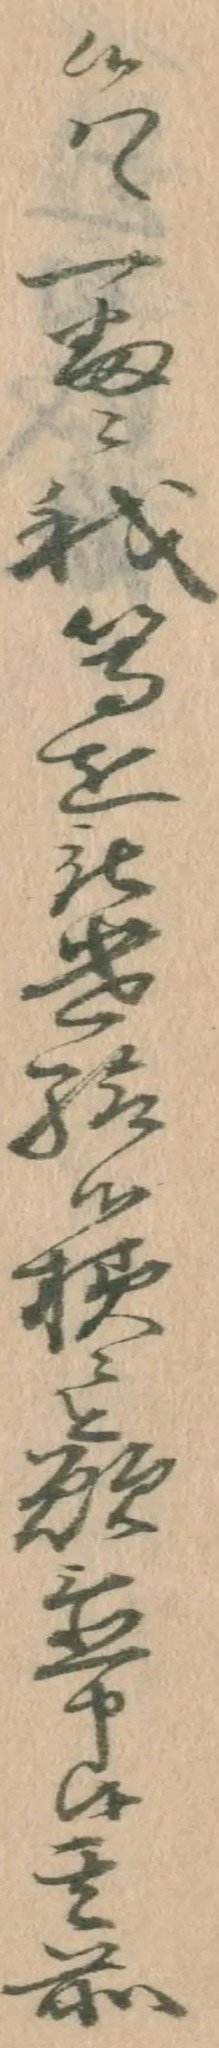候はゝ一番に我等を被遣給候様にと願置申候其前
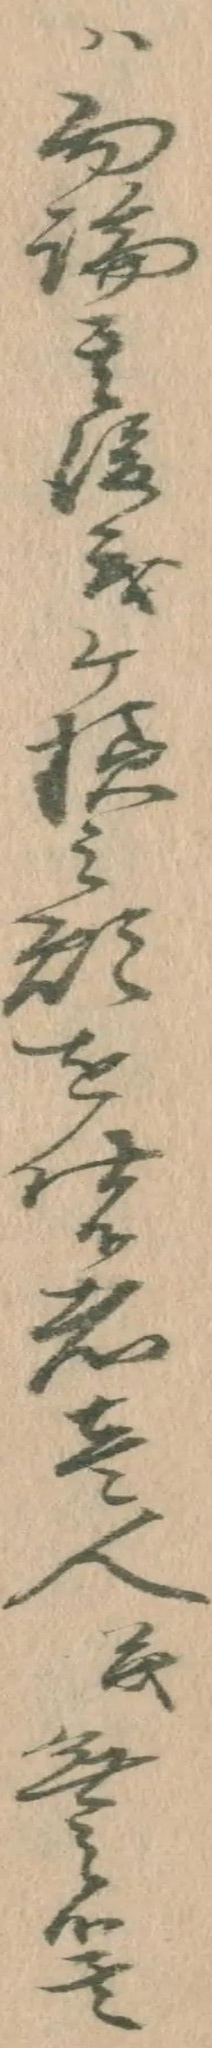は勿論其後茂け様之願を仕候者一壱人茂無之候其
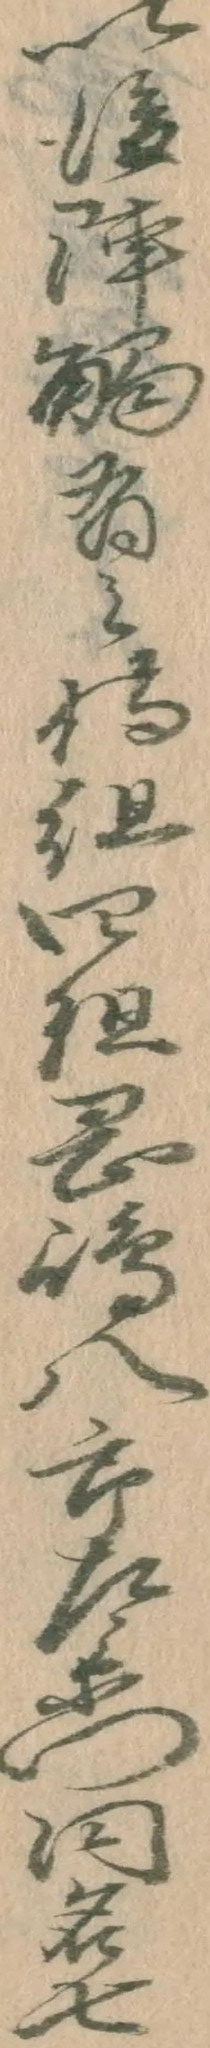以後陣触有之侍組四組岡島八郎左衛門同名七
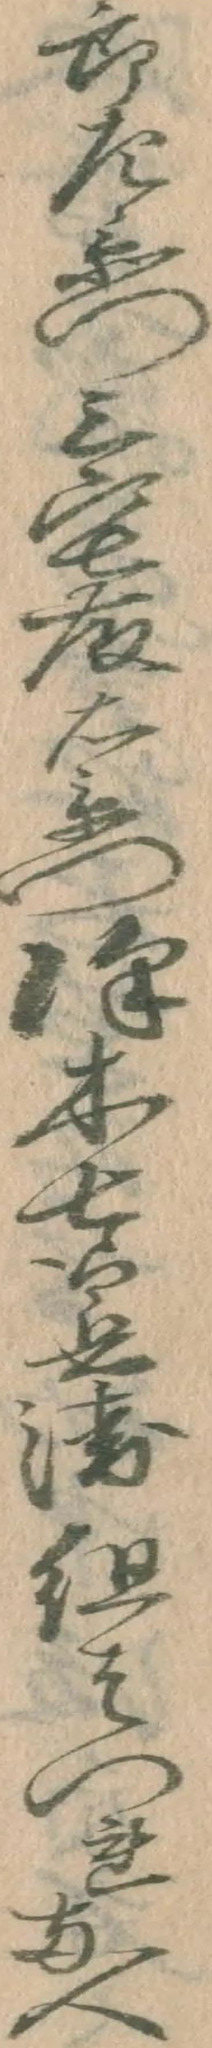郎左衛門三宅藤右衛門沢木七郎兵衛組者つ連両人
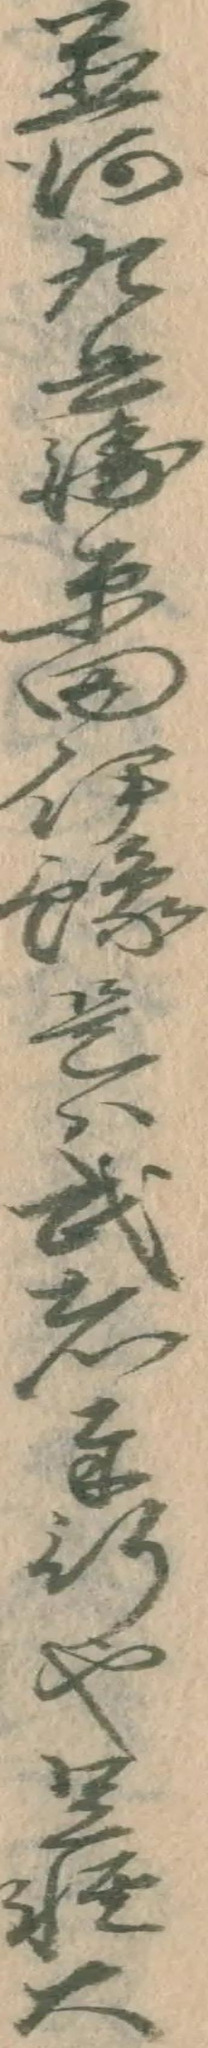並河久兵衛原田伊予是は武者奉行也足軽大
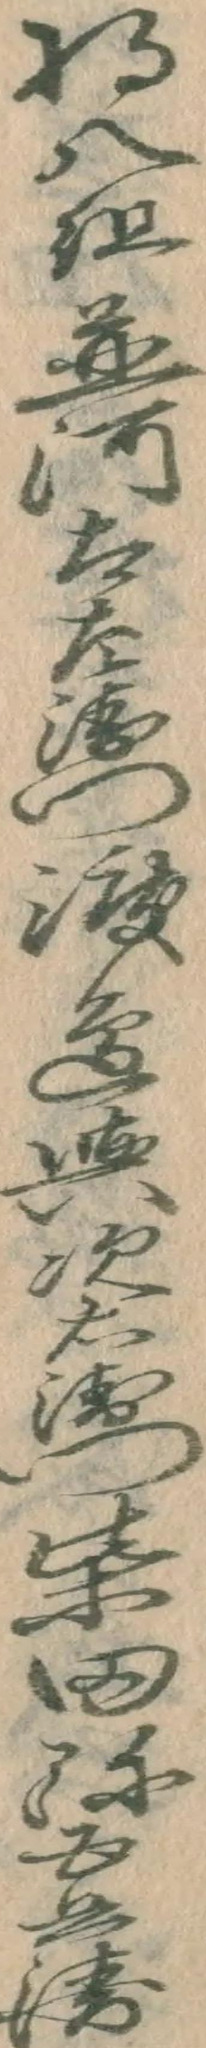将八組並河太左衛門渡辺与次右衛門柴田弥五兵衛
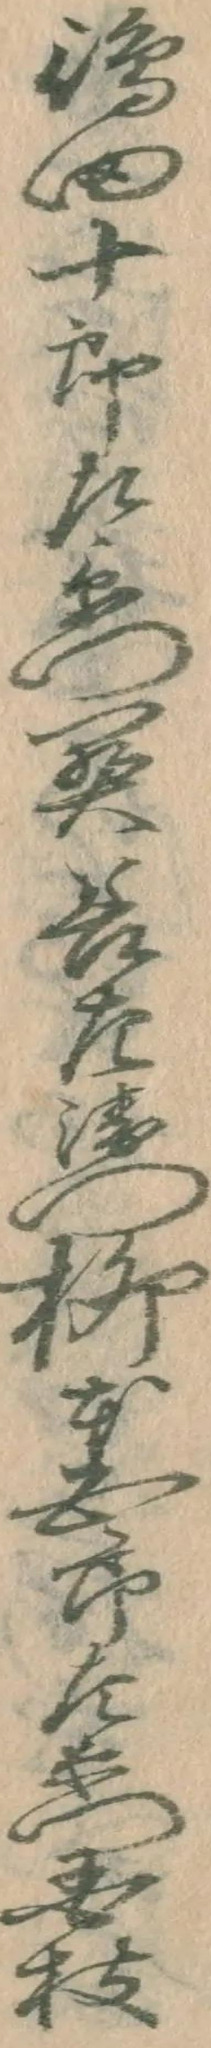島田十郎左衛門関善左衛門柳本五郎左衛門国枝
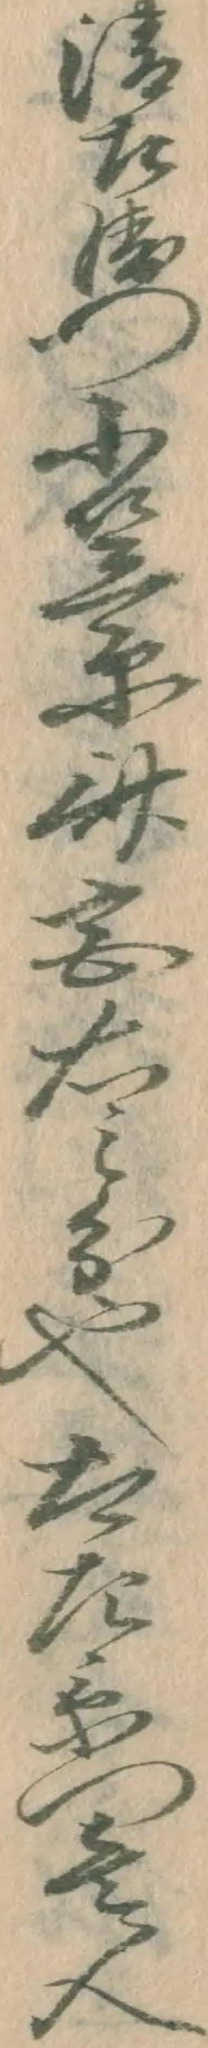清左衛門小笠原斎宮右之分也太左衛門壱人
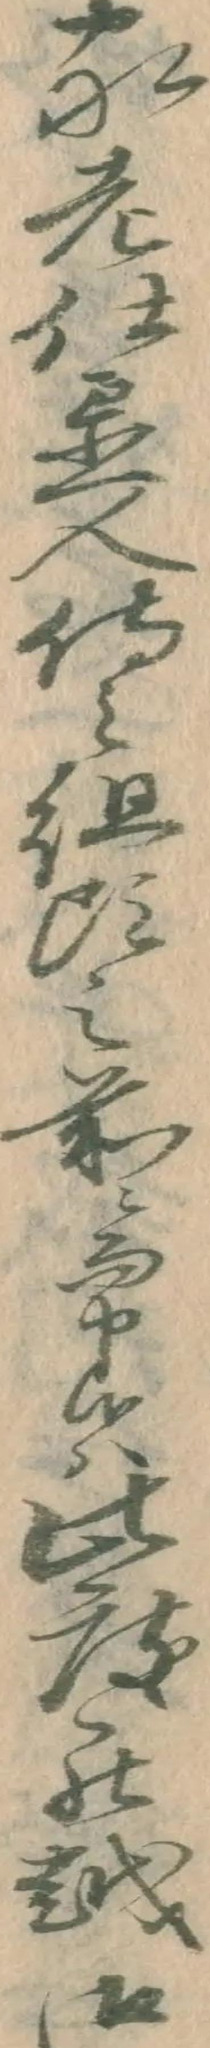家老仕置人侍之組頭之前に而申候は此度罷越御

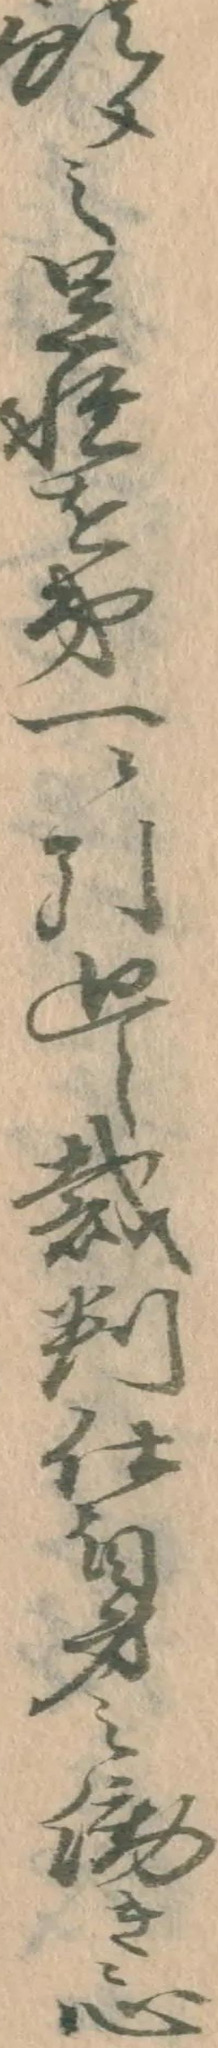預之足軽を第一に引廻し裁判仕自身之働きに心
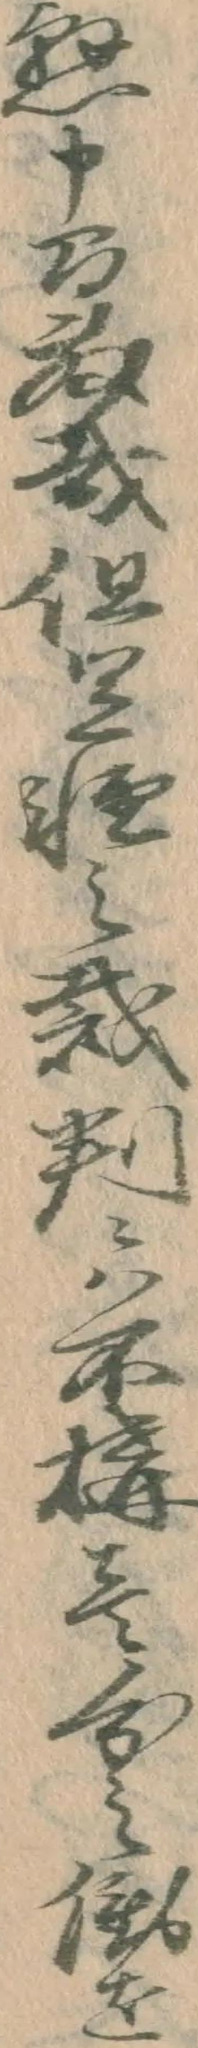懸申間敷哉但足軽之裁判には不構壱分之働を
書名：切支丹御退治記 49巻. [2]
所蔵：国立国会図書館 National Diet Library, JAPAN
